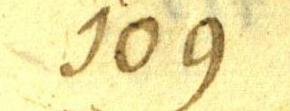109
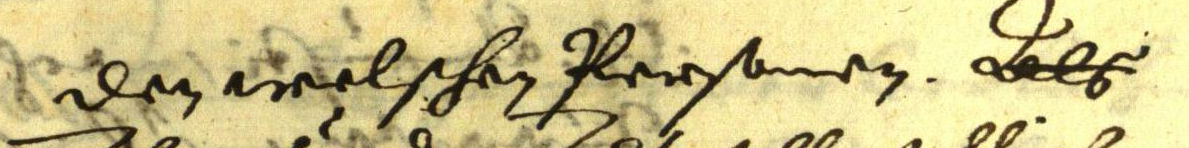den welschen Personen. Als
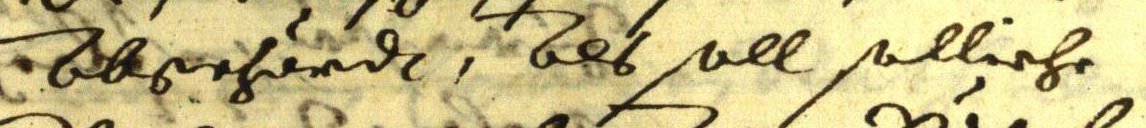Abgehōrdt, Als soll solliche
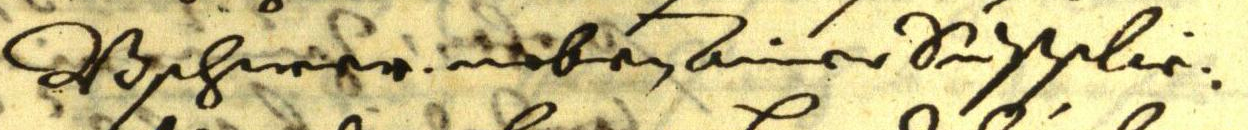Bschwer. neben Ainer SūPplic¬
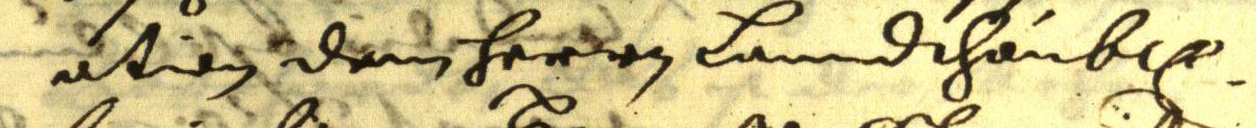ation dem herrn Lanndthaūbt.
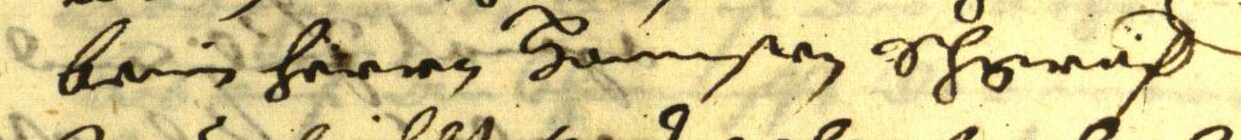beim Herrn Hannsen Schgraf
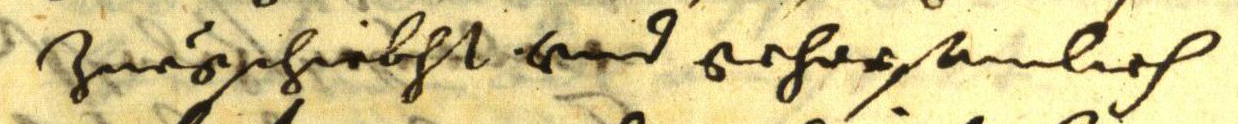Zūegschickht. vnd gehorsamlich
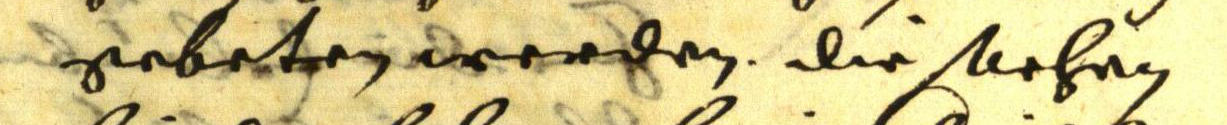gebeten werden. die sachen
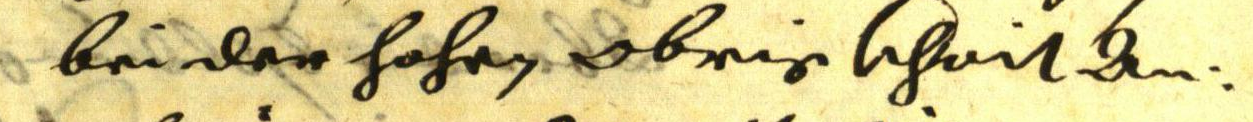bei der hohen obrigkhait An¬
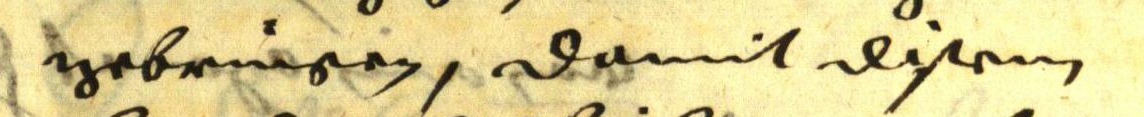zebringen, damit disem
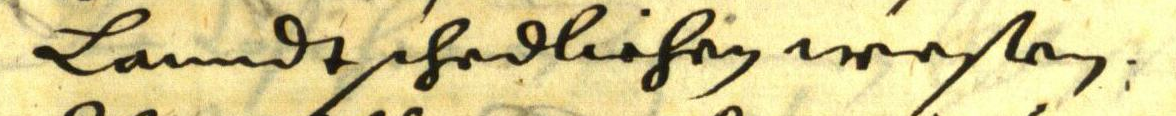Lanndtschedlichen wesen
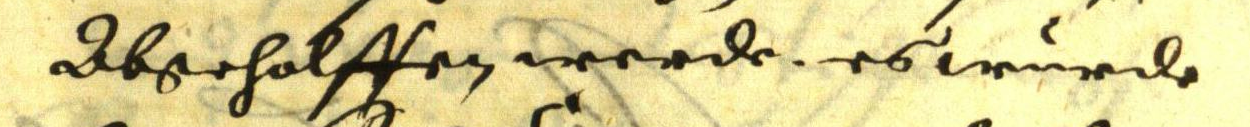Abgeholffen werde. es wūrde
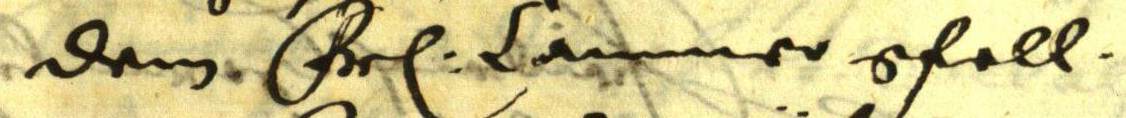dem Frl: Cammer gfell.
